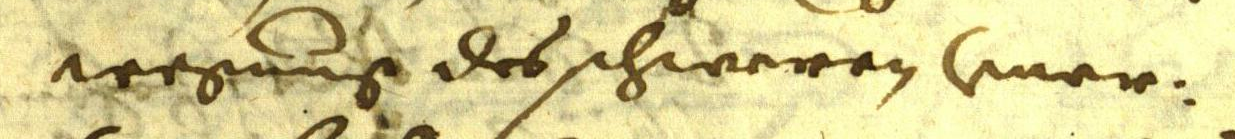wegūng des schweren vner¬
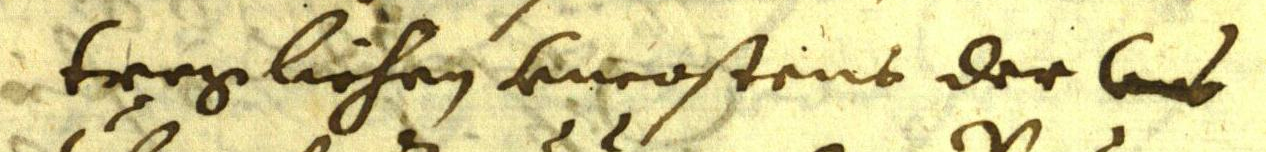traglichen vncostens der vns
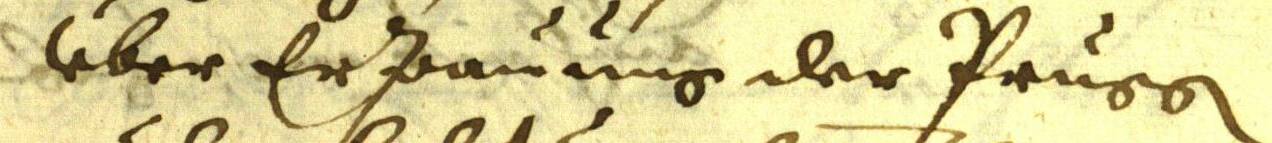v̄ber ErPaūūng der Prūgg
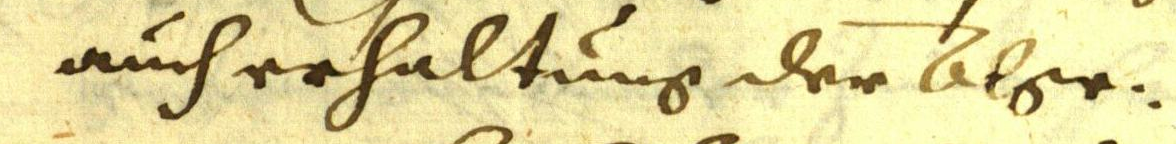aūch erhaltūng der Alge¬
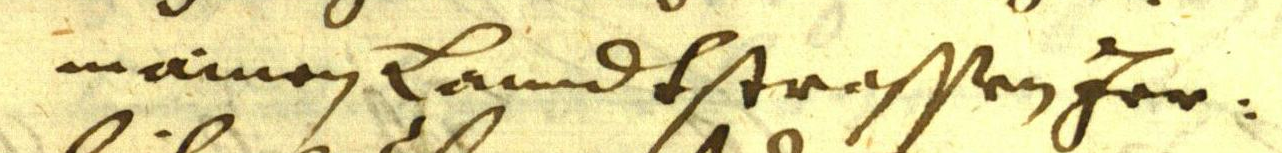mainen Landtstrassen Jer¬
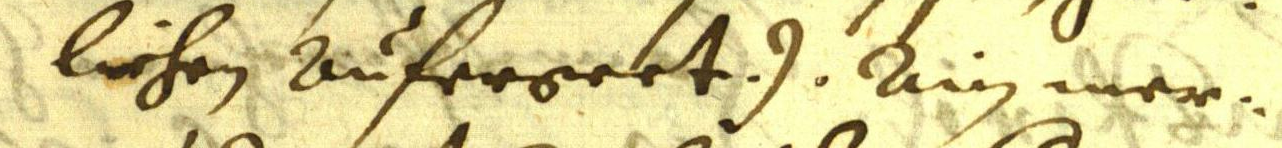lichen Aūfergeet.). Ain mer¬
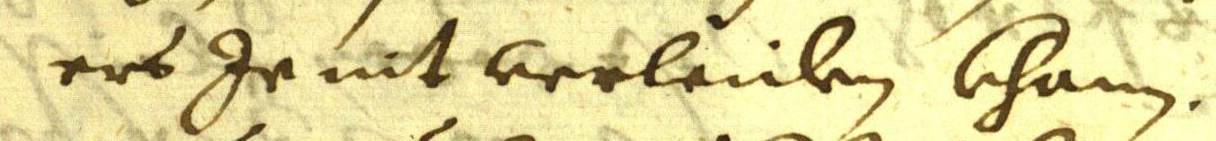ers Ir nit verleiden khann.
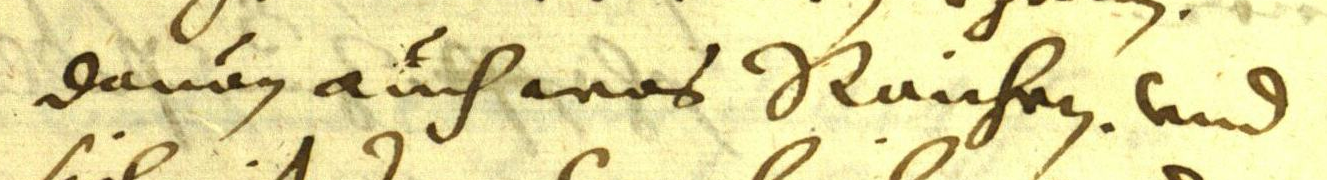davon aūch was Raichen. vnd
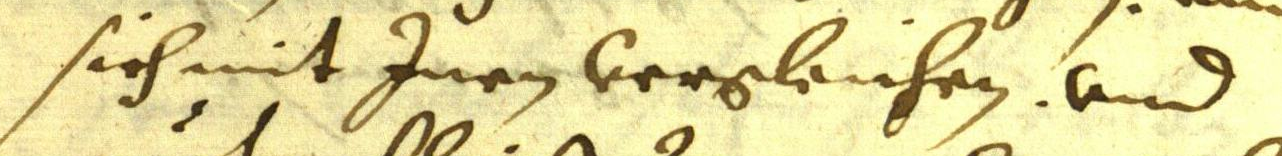sich mit Inen vergleichen. vnd
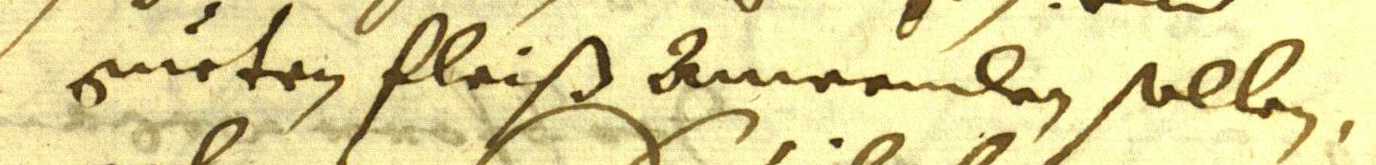gūeten fleiß Anwenden sollen,
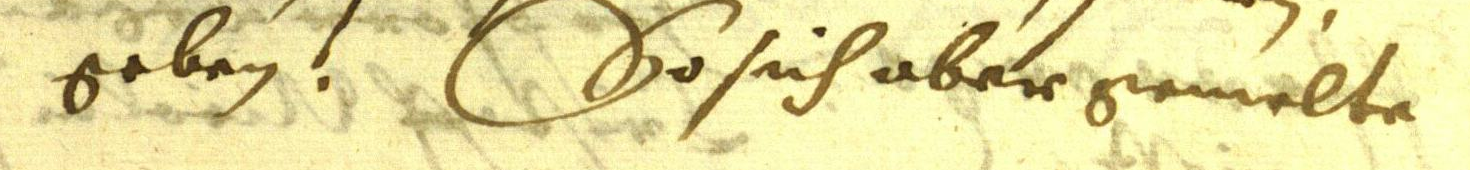geben. So sich aber gemelte
